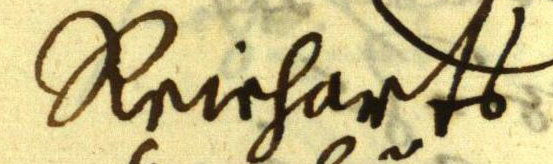Reicharts
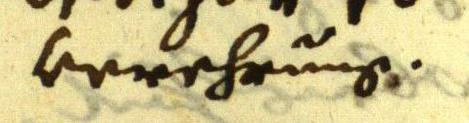verehrūng.
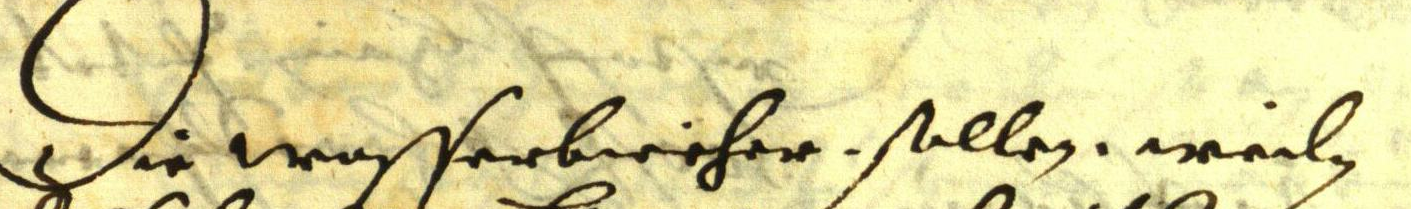Die Wasserbiecher. sollen. weiln
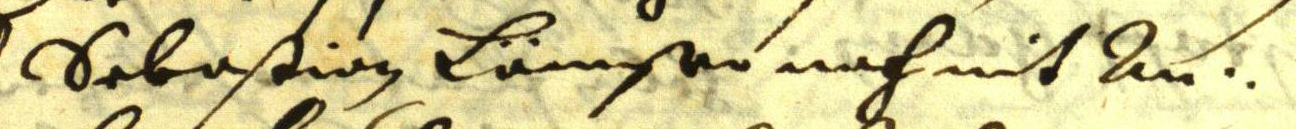Sebastian Lännser noch nit An¬
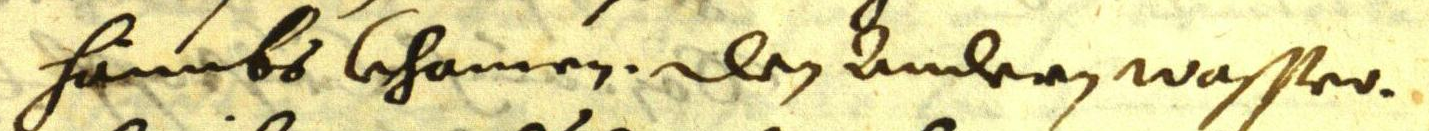haimbs khomen. den Andern Wasser¬
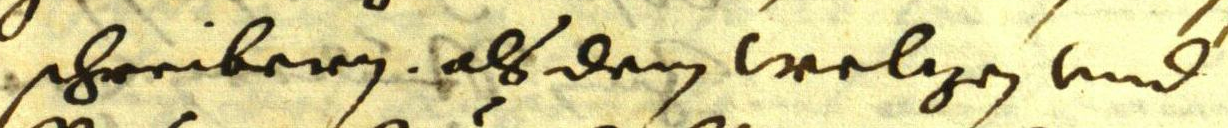schreibern. als dem Welzen vnd
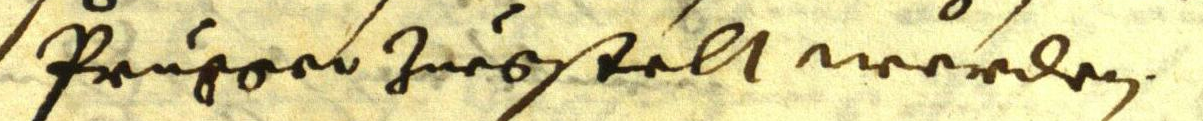Prūgger Zūegstelt werden.
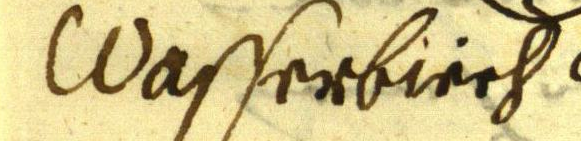Wasserbiech
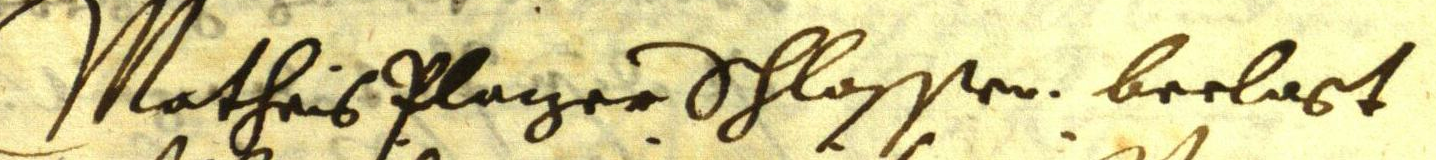Matheis Plazer Schlosser. beclagt
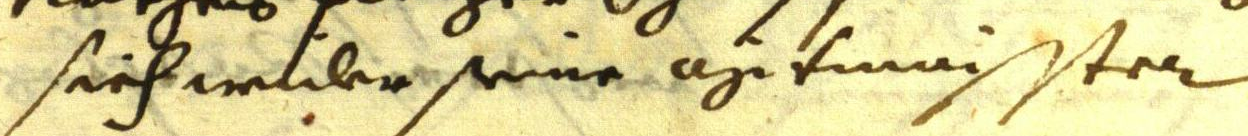sich wider seine Mitmaisster
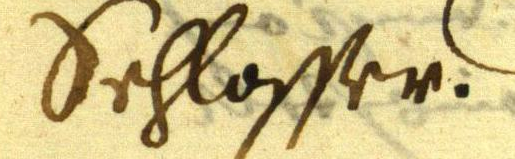Schlosser.
